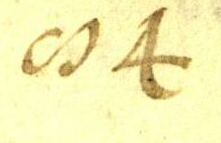84
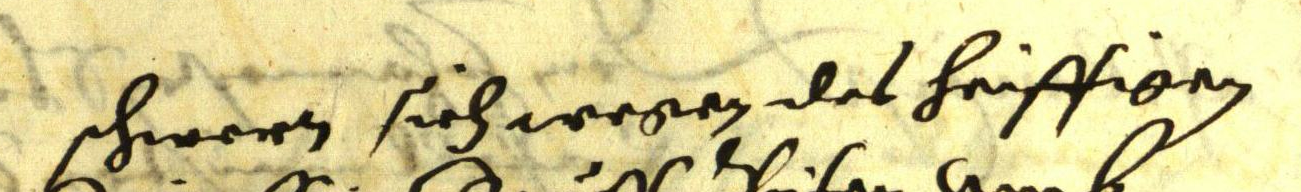schwern sich wegen des heiffigen
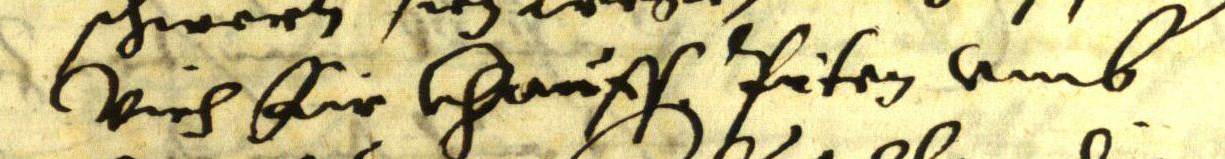Vieh Fir khaūfs. Piten vmb
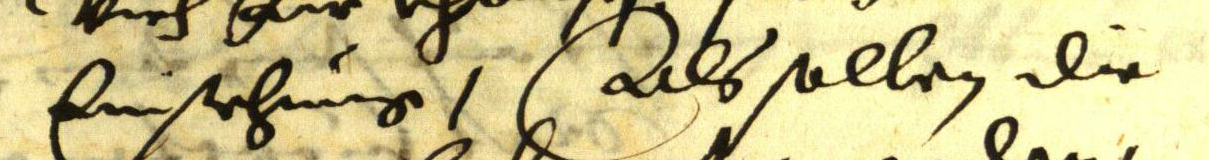Einsehūng, Als sollen die
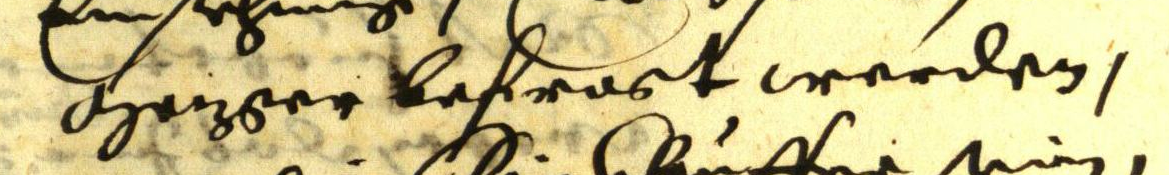Mezger befragt werden,
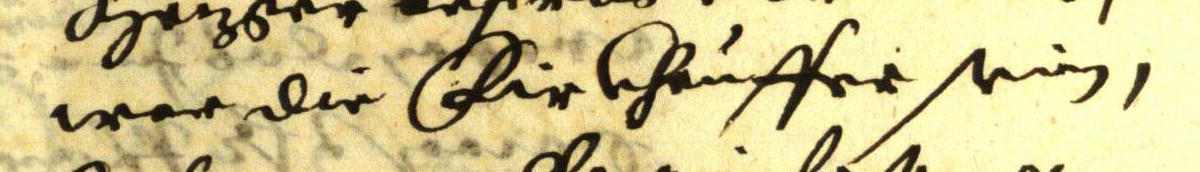wer die fir kheūffer sein,
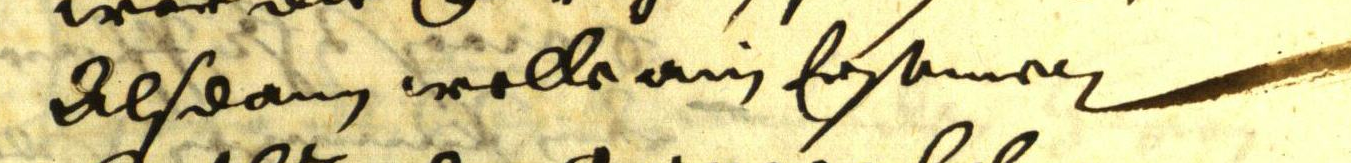Alsdann welle ain Ersamer
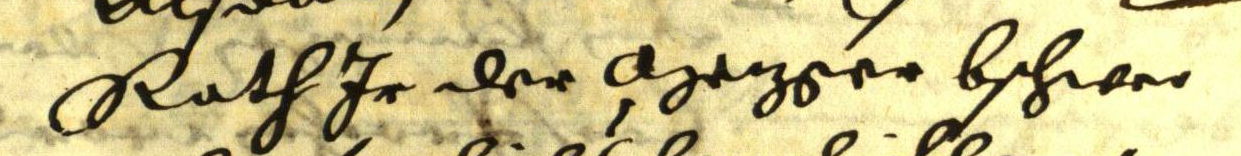Rath Ir der Mezger bschwer
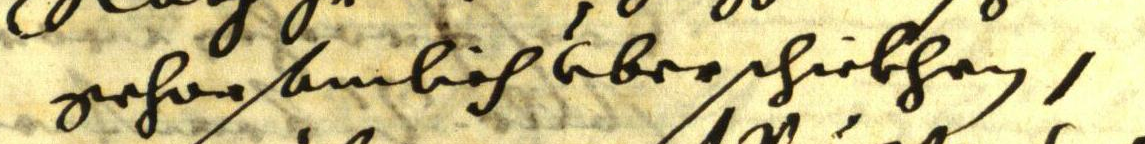gehorsamlich v̄berschickhen
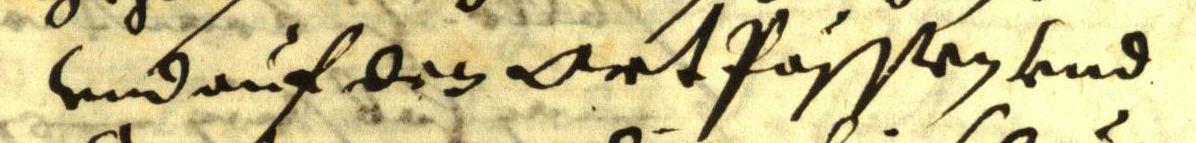vnd aūf den Ort Pāssen vnd
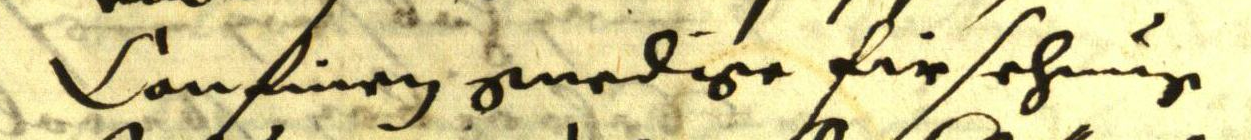Confinen gnedige firsehūng
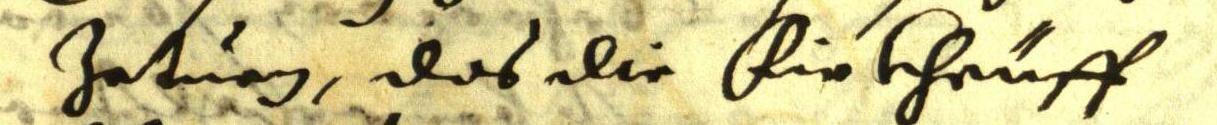Zetūen, das die fir kheūff
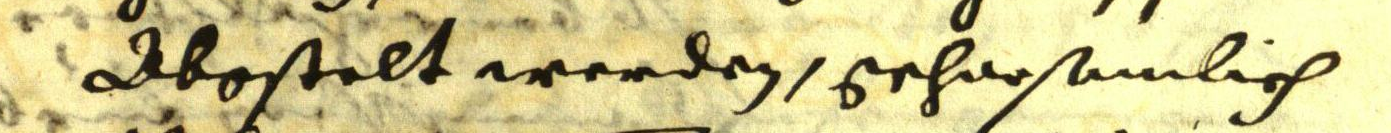Abgstelt werden, gehorsamlich
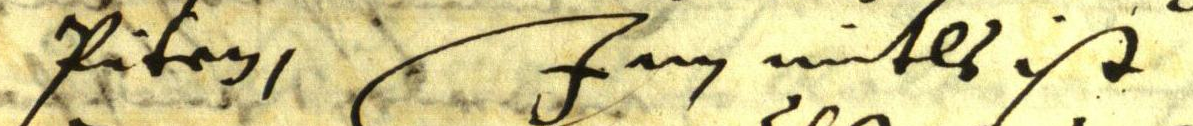Piten. Inn mitls ist
